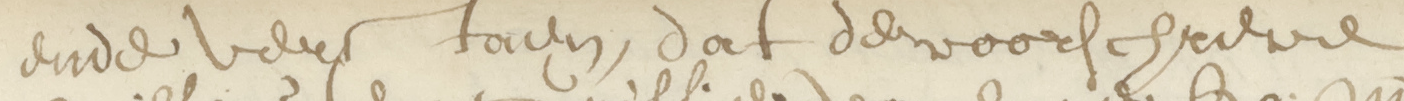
ende verstaen, dat de voorschreve
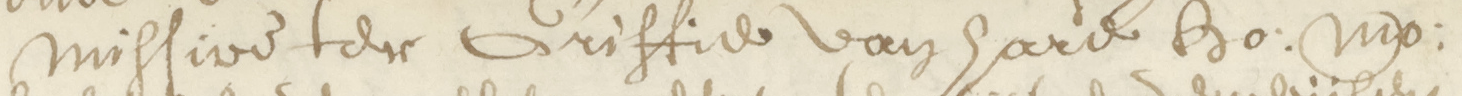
missive ter Griffie van hare Ho:Mo:
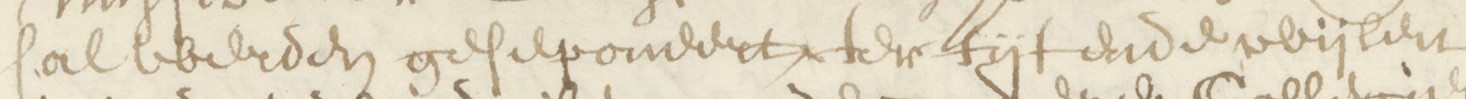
sal werden geseponeert, ter tijt ende wijlen
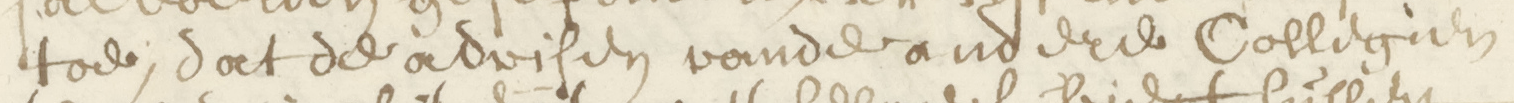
toe, dat de advisen vande andere Collegien
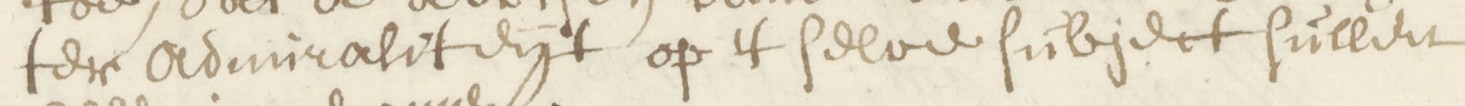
ter Admiraliteijt op 't selve subject sullen
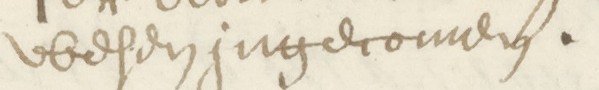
wesen ingecomen.
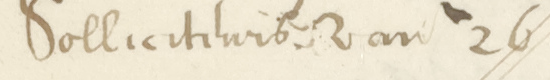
Solliciteurs van 26
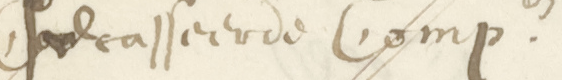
gecasseerde Compen.
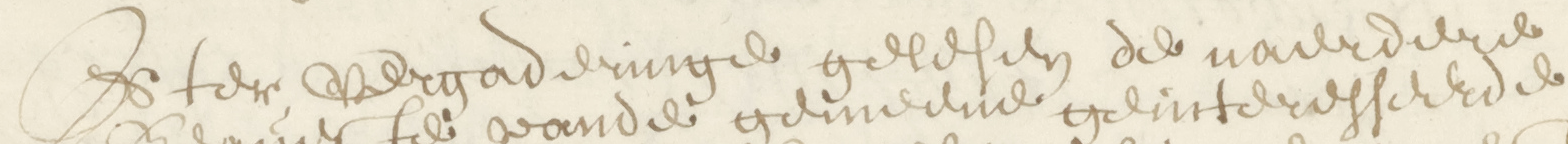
Is ter Vergaderinge gelesen de naerdere
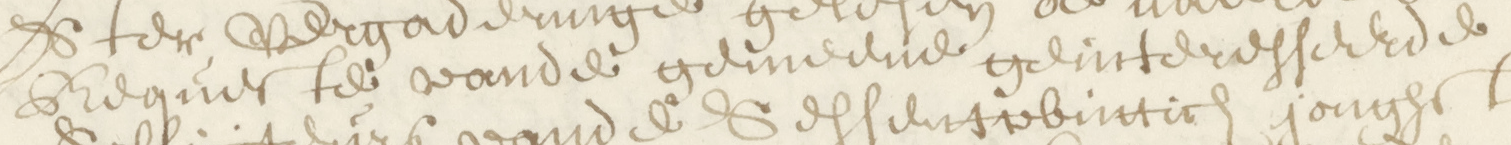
Requeste vande gemeene geinteresseerde
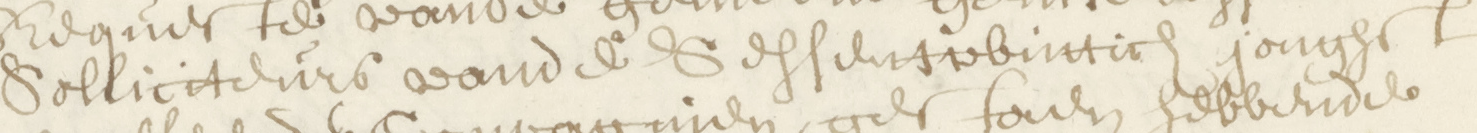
Solliciteurs vande Sessentwintich jonghst
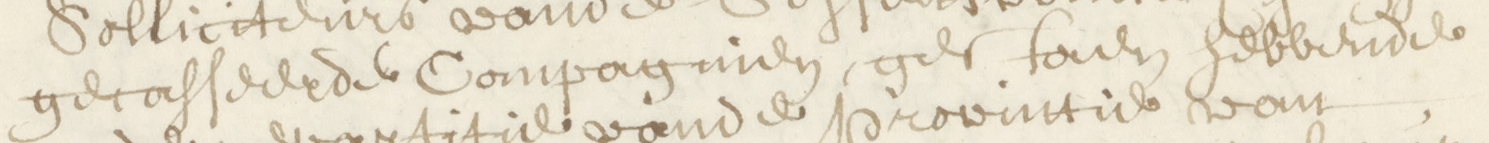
gecasseerde Compagnien, gestaen hebbende
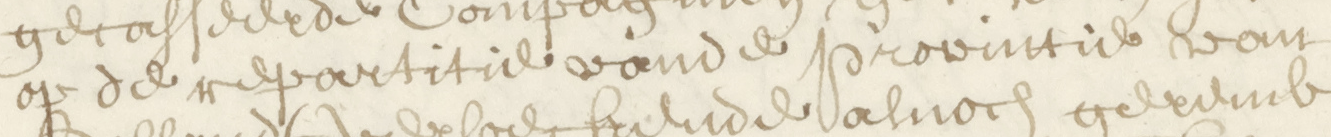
op de repartitie vande provintie van
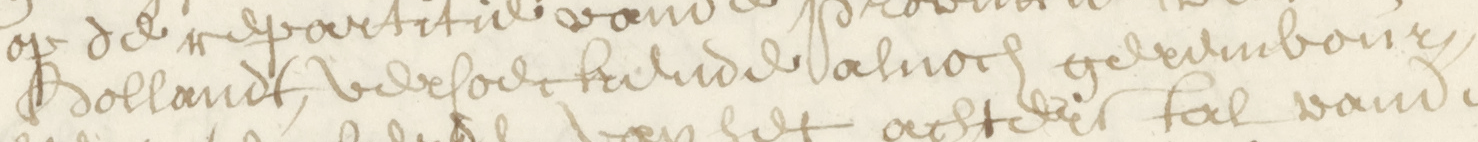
Hollandt, versoeckende alnoch gerembour,,
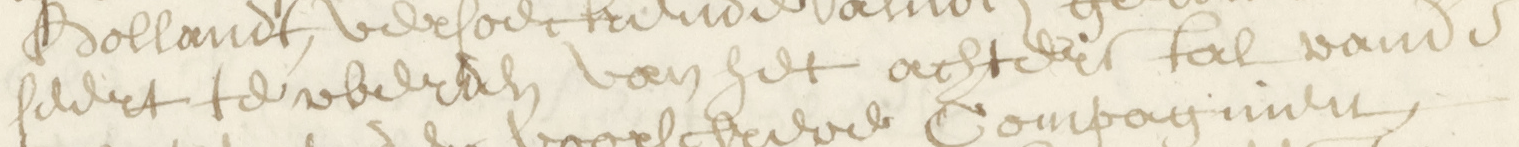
seert te werden van het achterstal vande
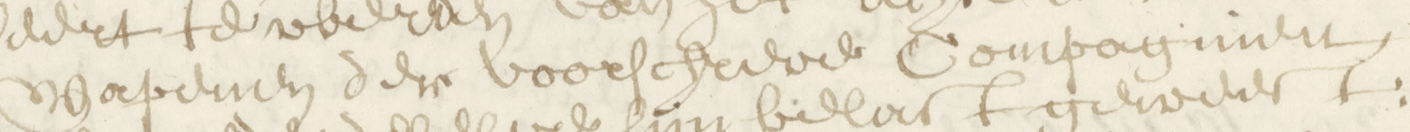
wapenen der voorschreve Compagnien,
